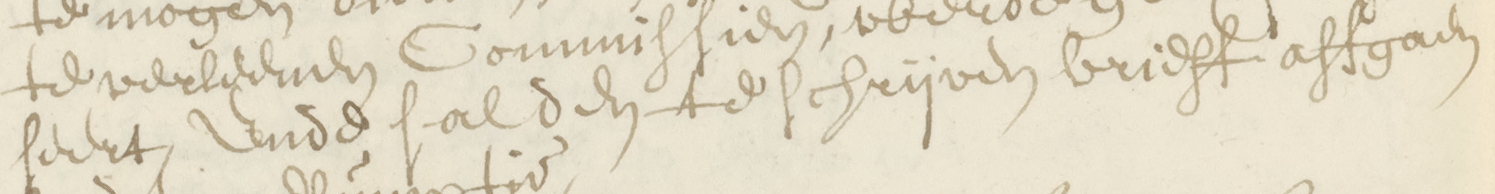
seert. Ende sal den te schrijven brieff affgaen
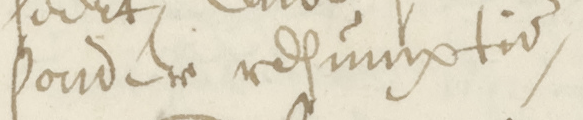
sonder resumptie.
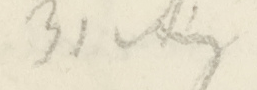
31 Aug
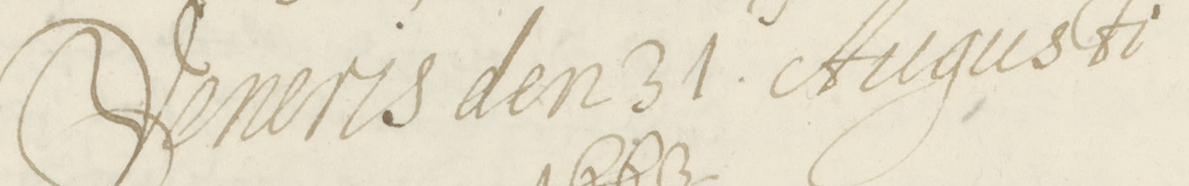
Veneris den 31en. Augusti
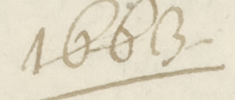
1663.
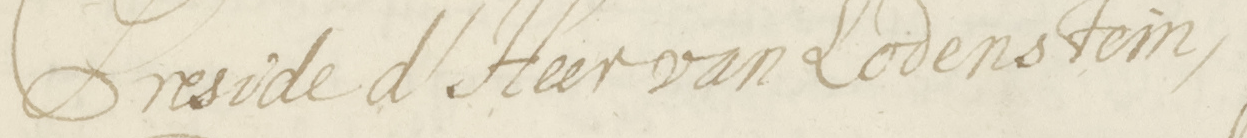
Preside d'Heer van Lodenstein,
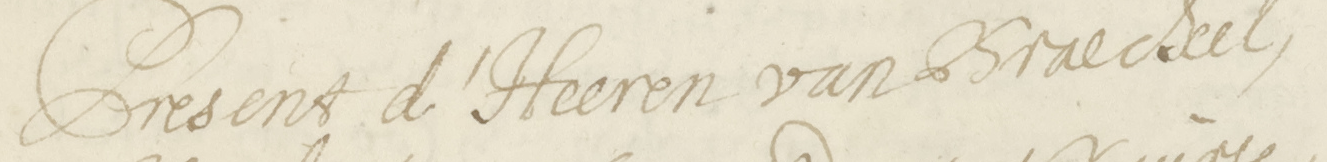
Present d'Heeren van Braeckel,
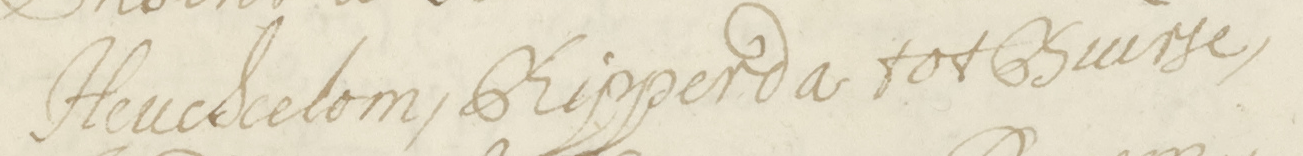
Heuckelom, Ripperda tot Buirse,
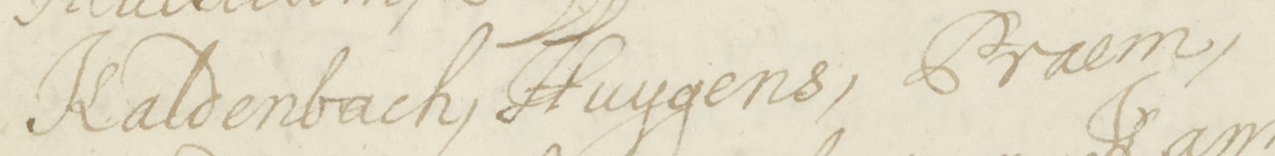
Kaldenbach, Huygens, Braem,
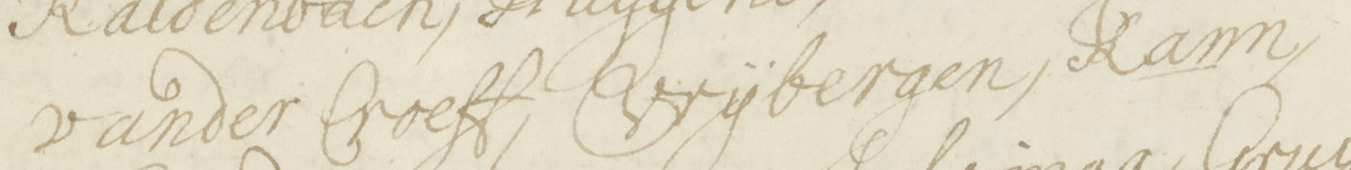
vander Croeff, Vrijbergen, Kann,
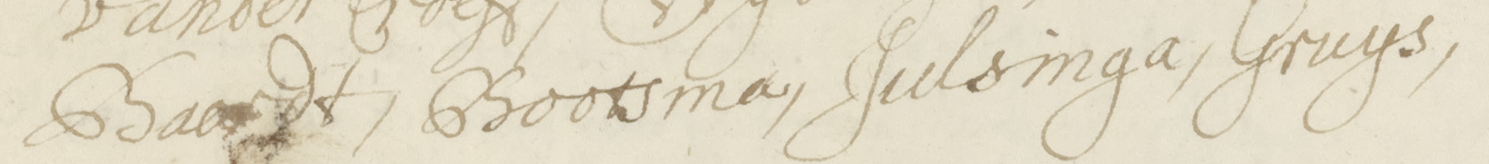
Baerdt, Bootsma, Julsinga, Gruys.
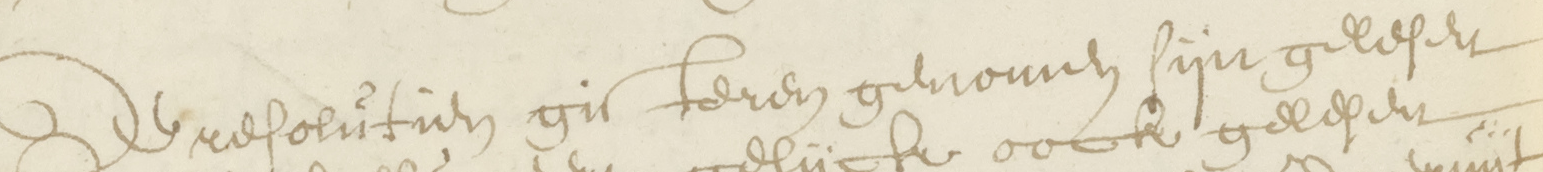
De resolutien gisteren genomen sijn gelesen
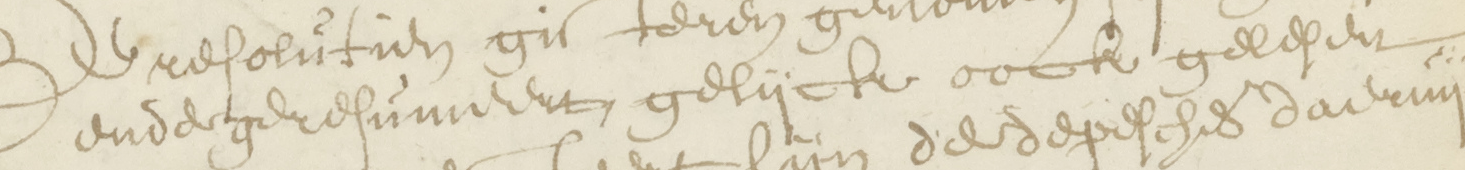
ende geresumeert, gelijck oock gelesen
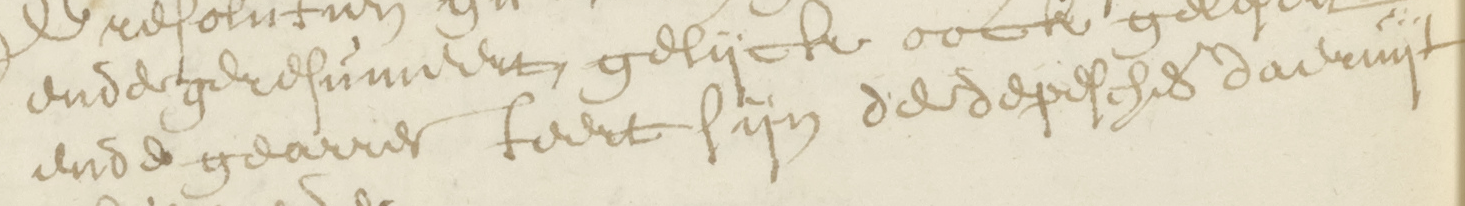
ende gearresteert sijn de depeschen daeruijt
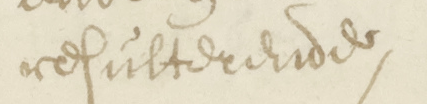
resulterende.
